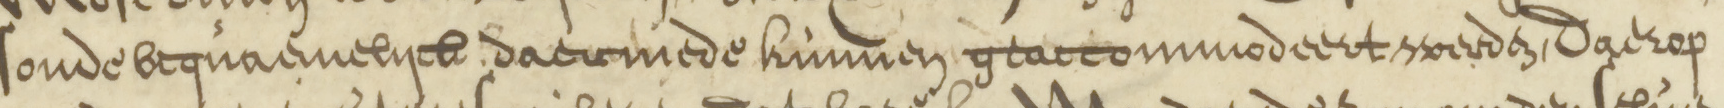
soude bequaemelyck, daermede kunnen geaccommodeert werden. Daerop
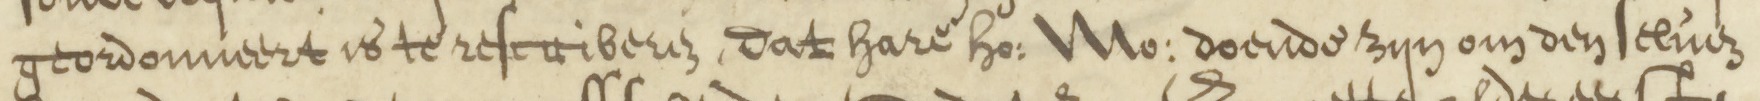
geordonneert is te rescriberen, dat hare ho:Mo: doende zyn om den seluen
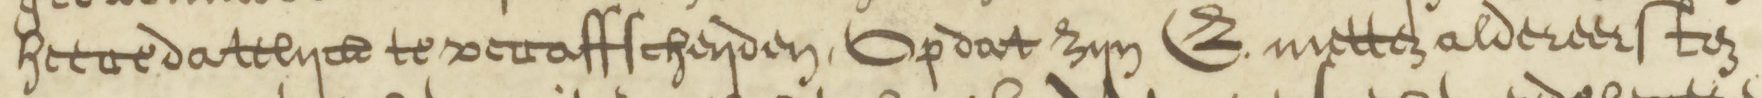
heere datelyck te veraffscheyden, Opdat zyn E. metten aldereersten
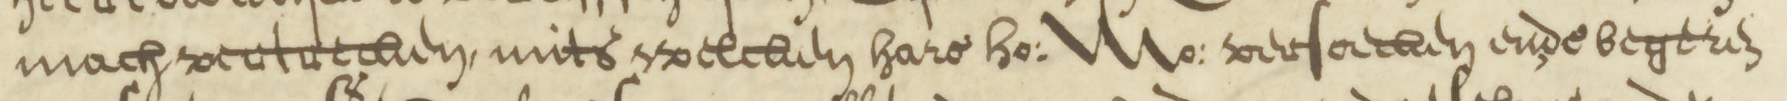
mach vertrecken, mits welcken hare ho:Mo: versoecken ende begeren
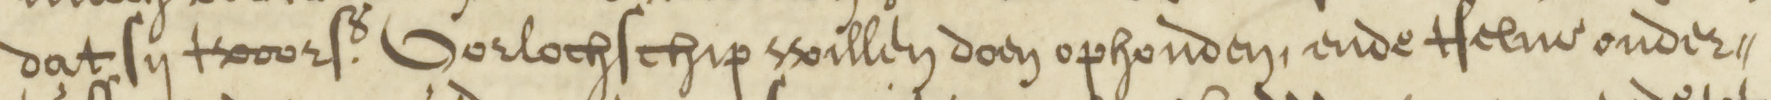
dat sy tvoors. Oorlochschip willen doen ophouden, ende tselue onder„
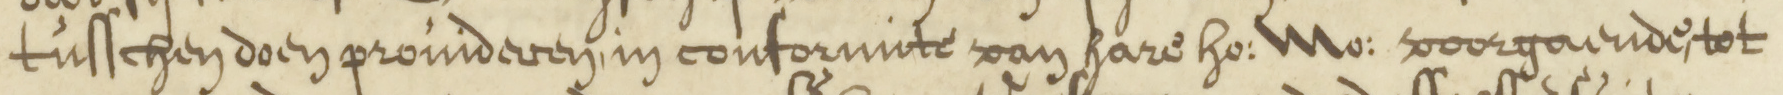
tusschen doen prouideren in conformite van hare ho:Mo: voorgaende, tot
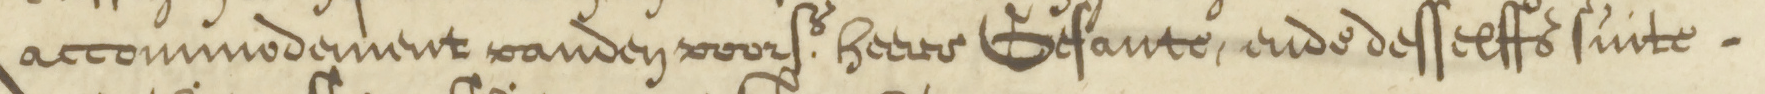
accommodement vanden voors. heere Gesante, ende desselffs suite -
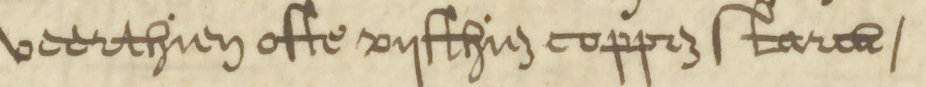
veerthien ofte vyfthien coppen starck.
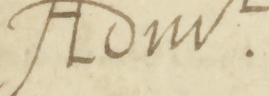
Admt.
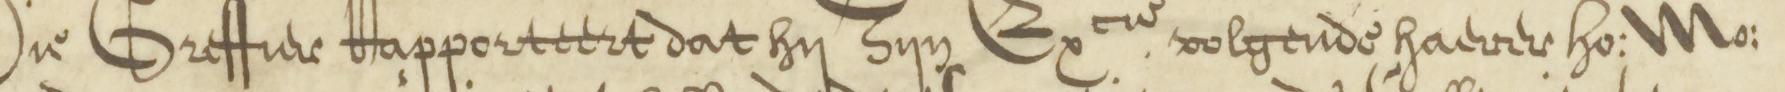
Die Griffier Rapporteert dat hy zyn Excie. volgende haerer ho:Mo:
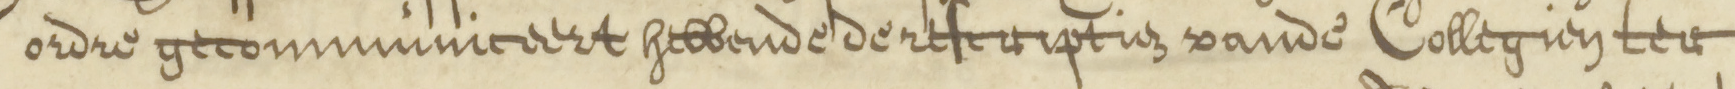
ordre gecommuniceert hebbende de rescriptien vande Collegien ter
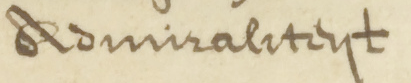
Admiraliteyt
